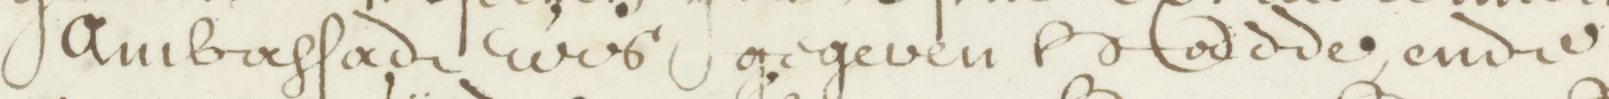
Ambassadeurs gegeven hadde, ende
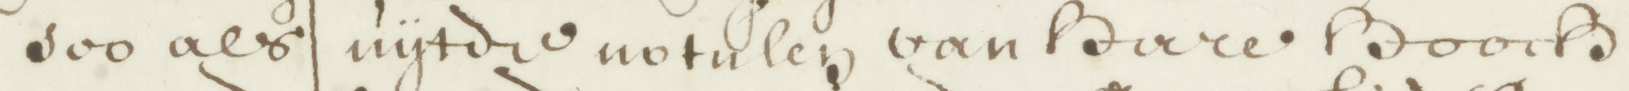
soo als uijt de notulen van hare Hooch
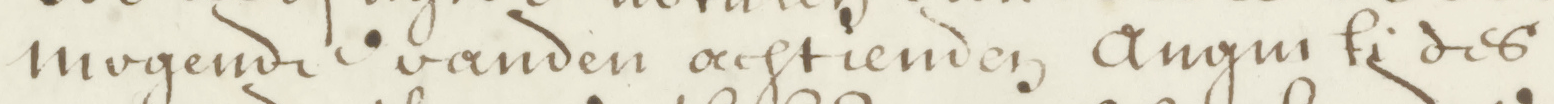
Mogende vanden achtienden Augusti des
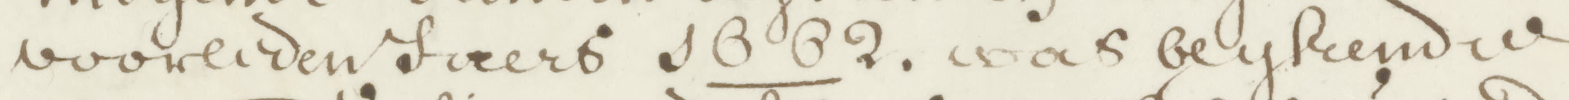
voorleden jaers 1662 was blijkende
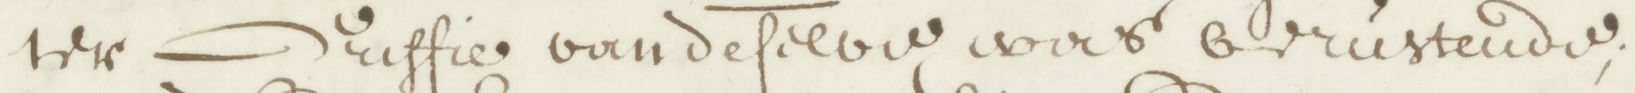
ter Griffie van deselve voors berustende.
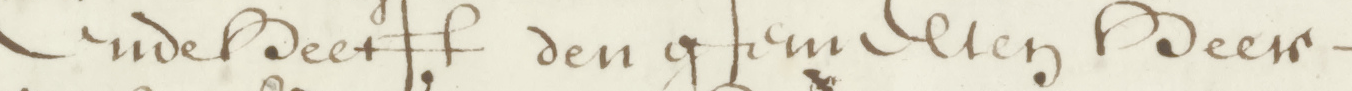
Ende heeft den gemelten heer
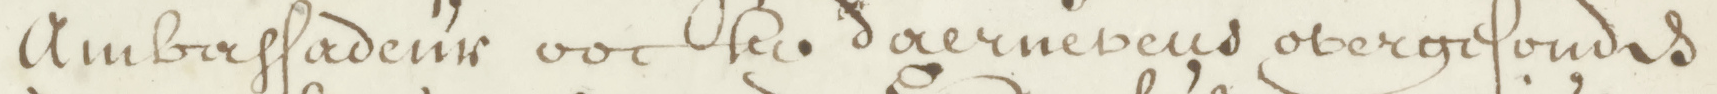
Ambassadeur oock daernevens overgesonden
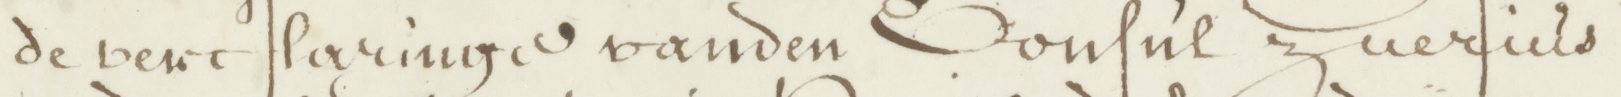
de verclaringe vanden Consul Zuerius
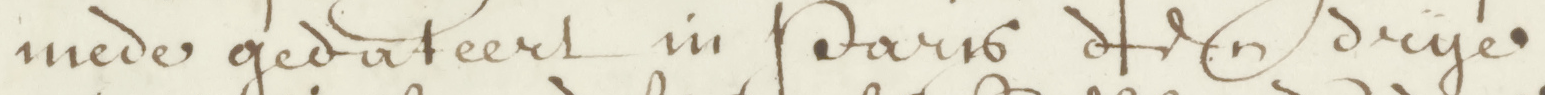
mede gedateert in Paris den drije
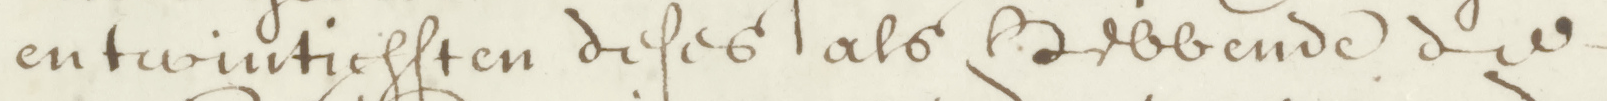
en twintichsten deses als hebbende de
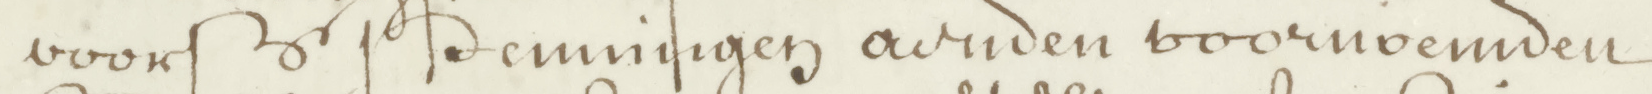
voors penningen aenden voornoemden
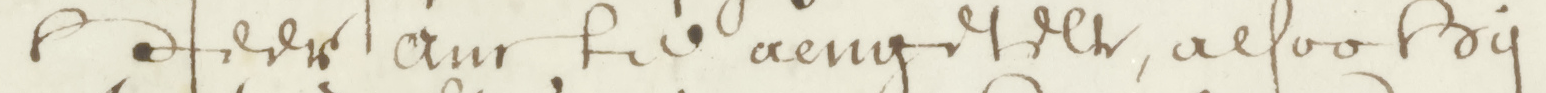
heer Anste aengetelt, alsoo hij
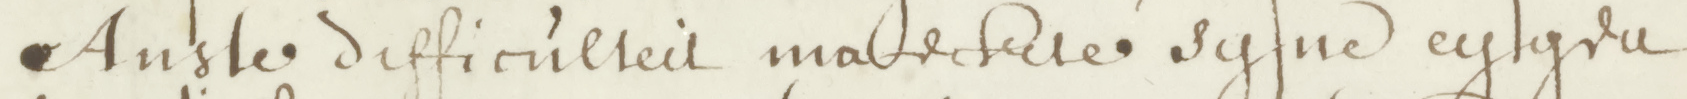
Anste difficulteit maeckte sijnen eijgen
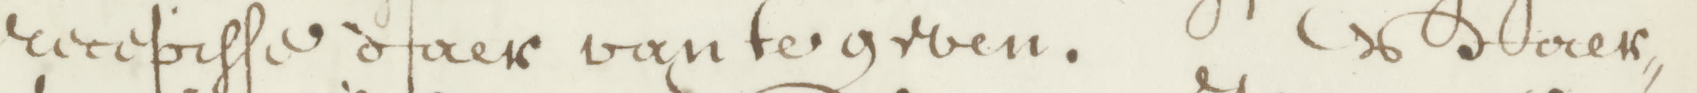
recepisse daer van te geven. Daer„
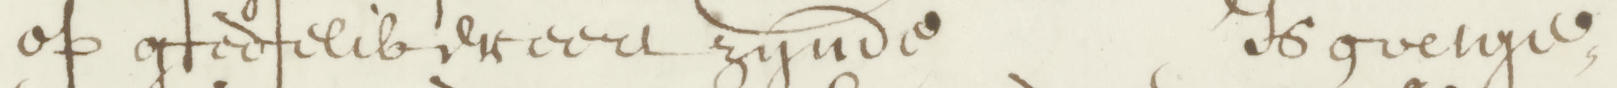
op gedelibereert zijnde Is goetge„
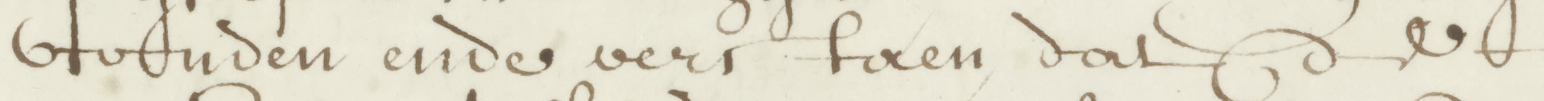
vonden ende verstaen dat de
